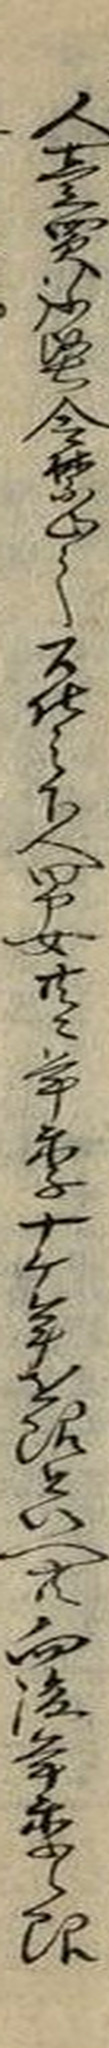人売買弥堅令禁止之召仕之下人男女共ニ年季十ケ年を限といへ共向後年季之限
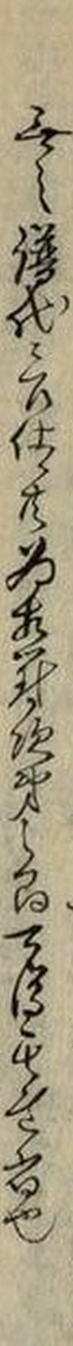無之譜代ニ召仕候共為相対次第之間可為其意者也
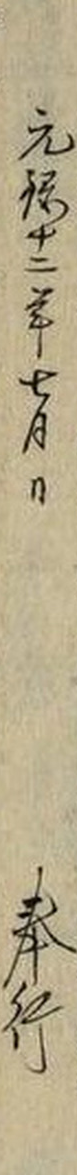元禄十二年七月日奉行
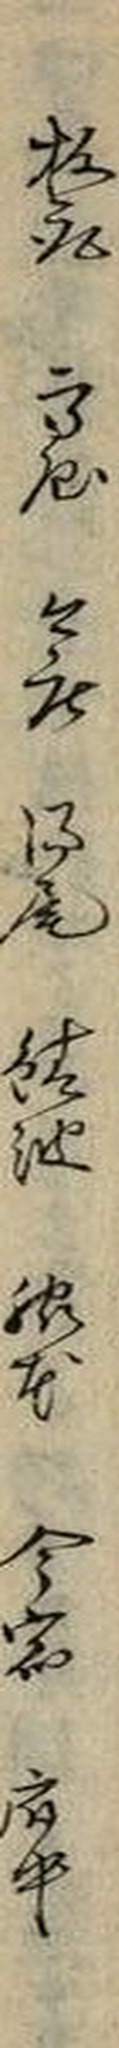板取二ツ屋今庄湯尾鯖波脇本今宿府中
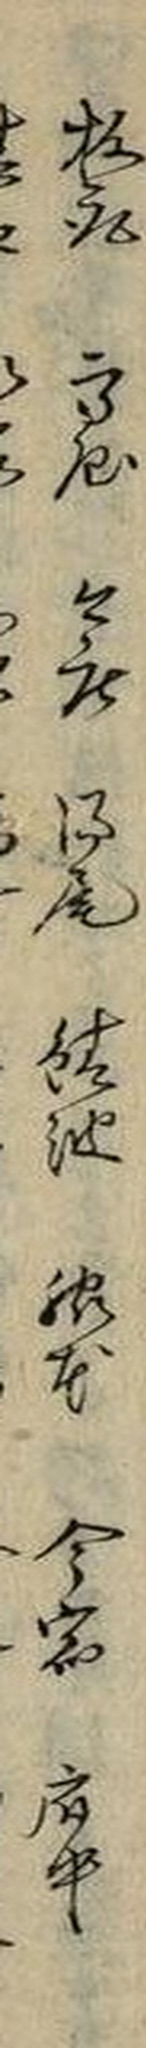板取二ツ屋今庄湯尾鯖波脇本今宿府中
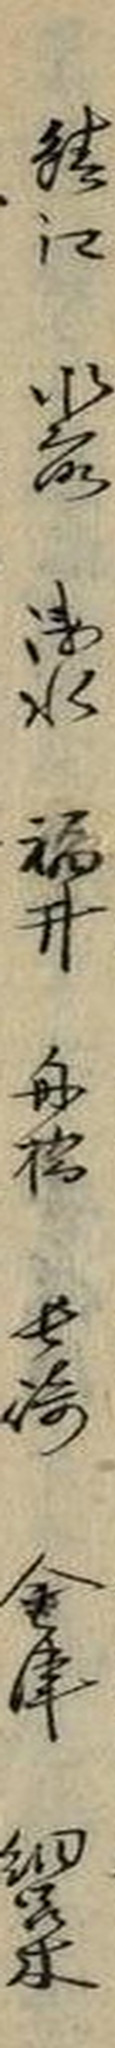鯖江水落浅水福井船橋長崎金津細呂木
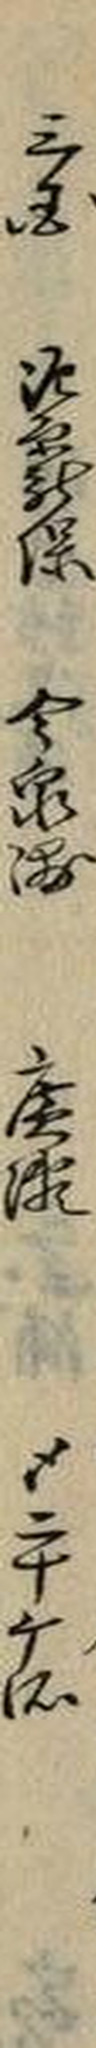三国泥原新保今泉浦広瀬〆二十ケ所
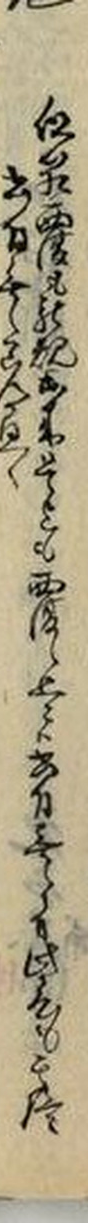但箱覆も新規出来是迄も覆之上ニハ書付無之ニ付此度も其儘
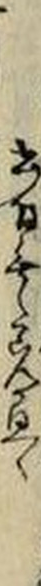書付無之差置候
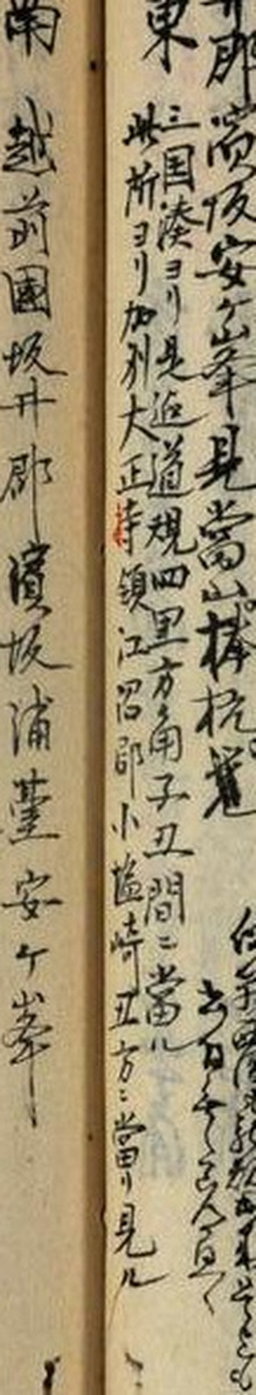此所ヨリ加州大正寺領江沼郡小塩崎丑方ニ当り見ル
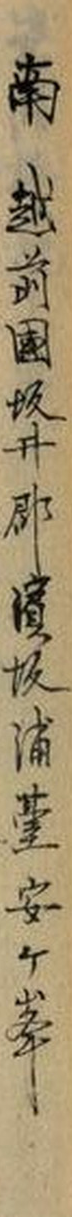南越前国坂井郡浜坂浦台安ケ峰
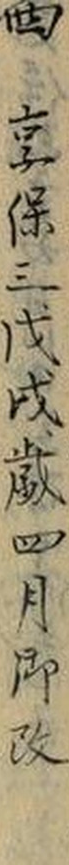西享保三戊戌歳四月御改
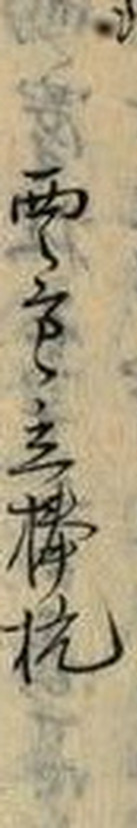西之方へ立棒杭
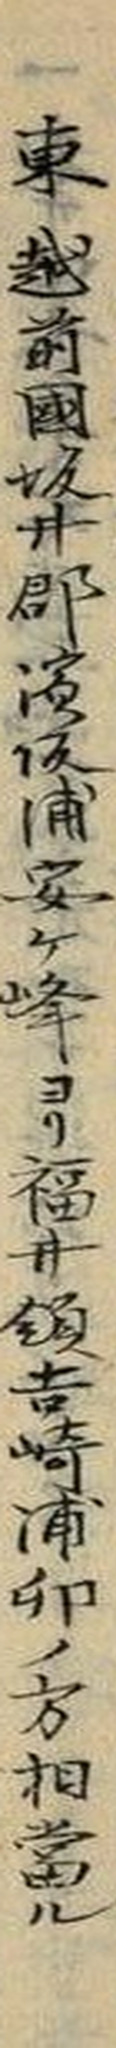東越前国坂井郡浜坂浦安ケ峰ヨリ福井領吉崎浦卯ノ方相当ル
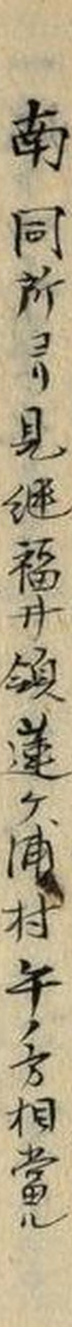南同所ヨリ見継福井領蓮ケ浦村午ノ方相当ル
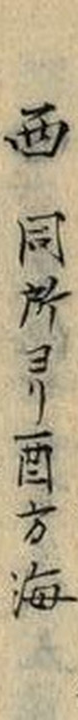西同所ヨリ酉方海
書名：御国他国諸事之部
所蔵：福井県文書館 Fukui Prefectural Archives
